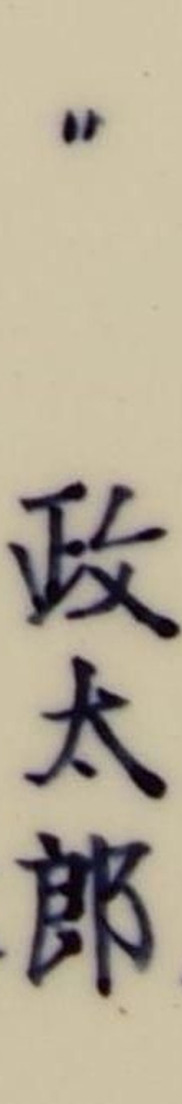政太郎
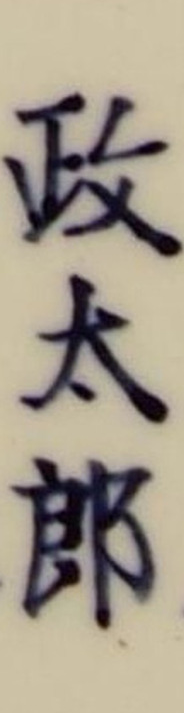政太郎
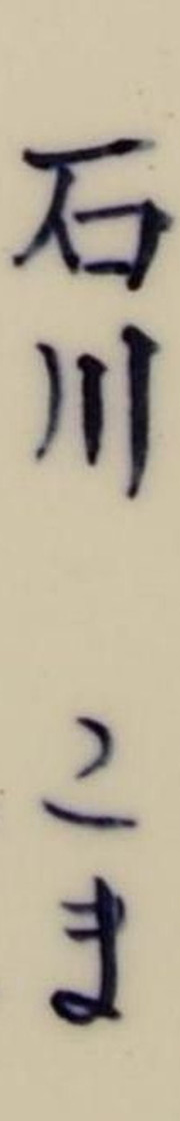石川こま
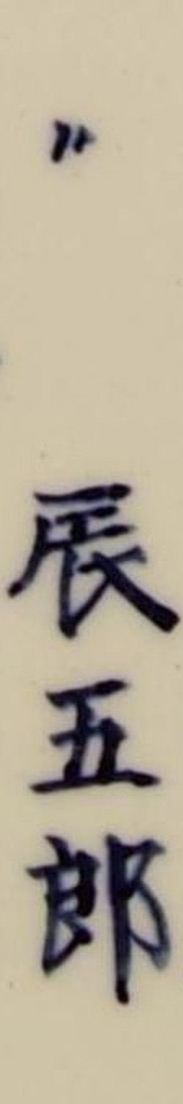辰五郎
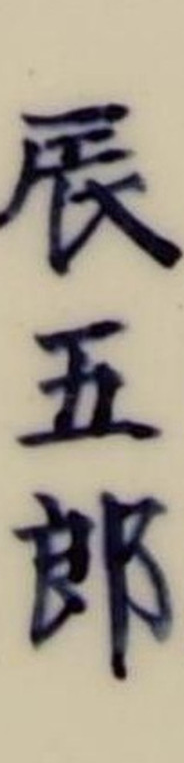辰五郎
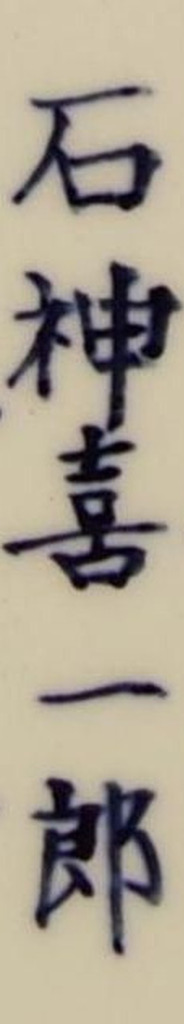石神喜一郎
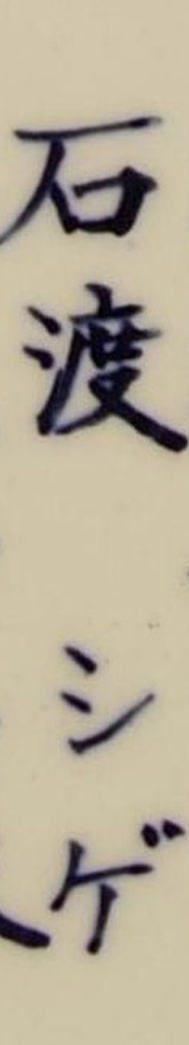石渡シゲ
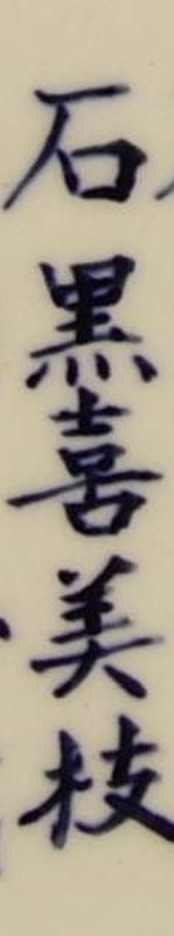石黒喜美枝
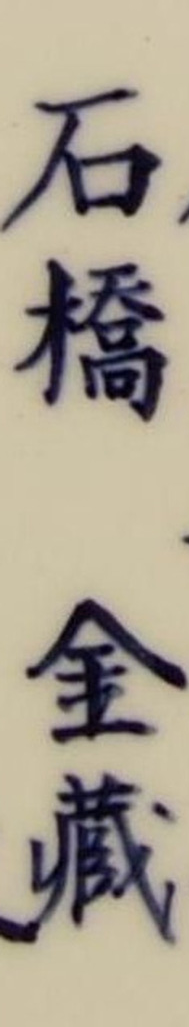石橋金蔵
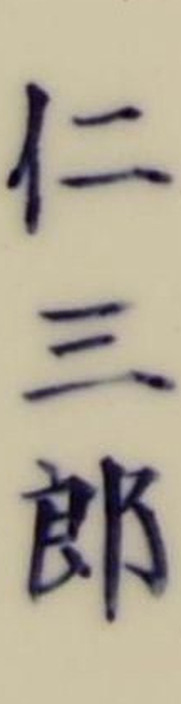仁三郎
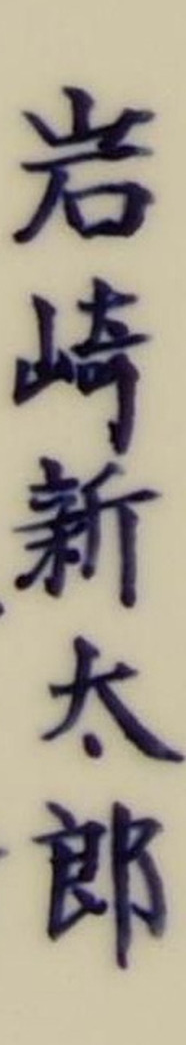岩崎新太郎
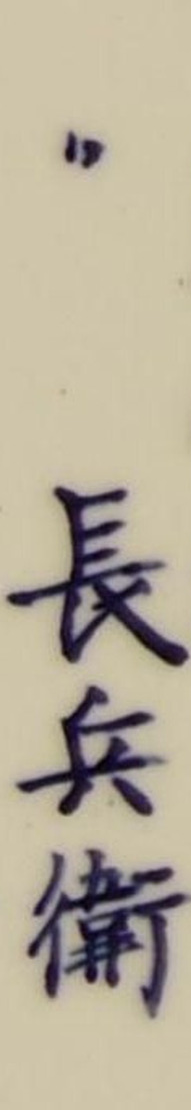長兵衛
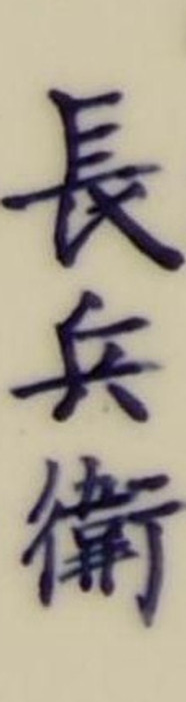長兵衛
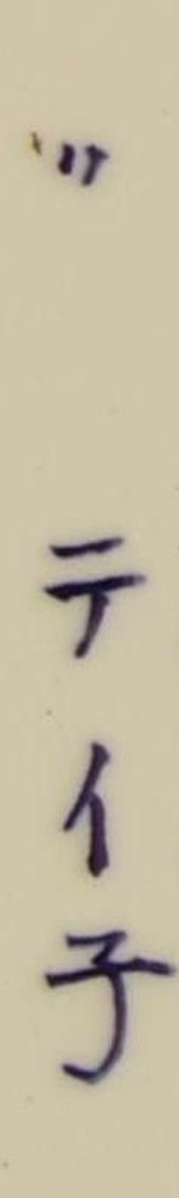テイ子
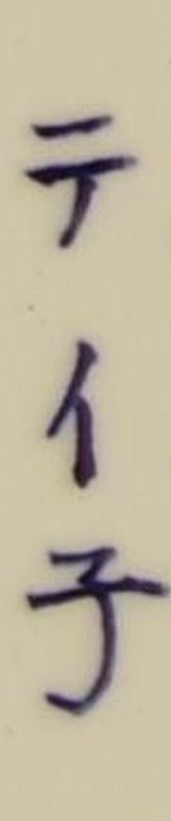テイ子

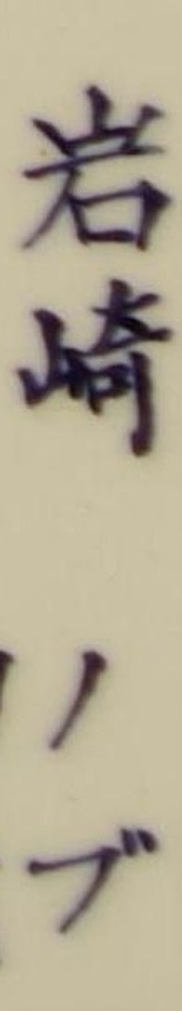岩崎ノブ
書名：E~L
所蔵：高野山金剛峯寺
